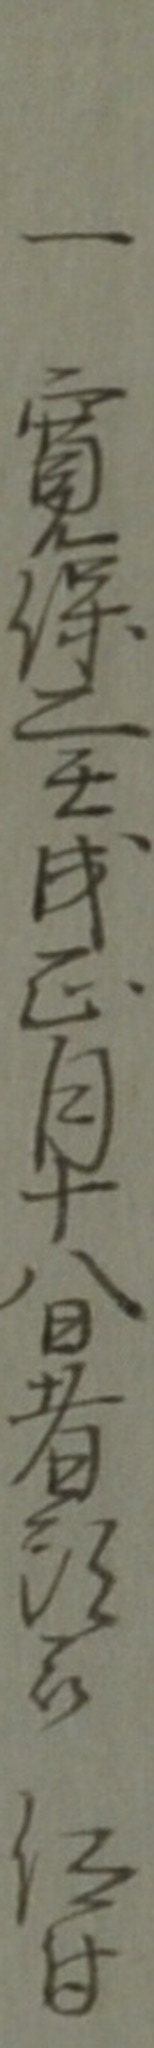一寛保二壬戌正月十八日者頭被仰付
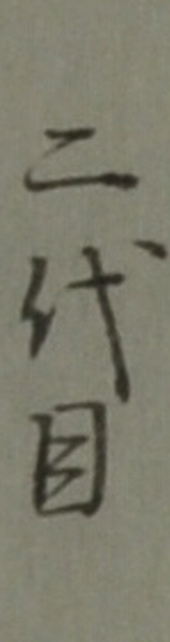二代目
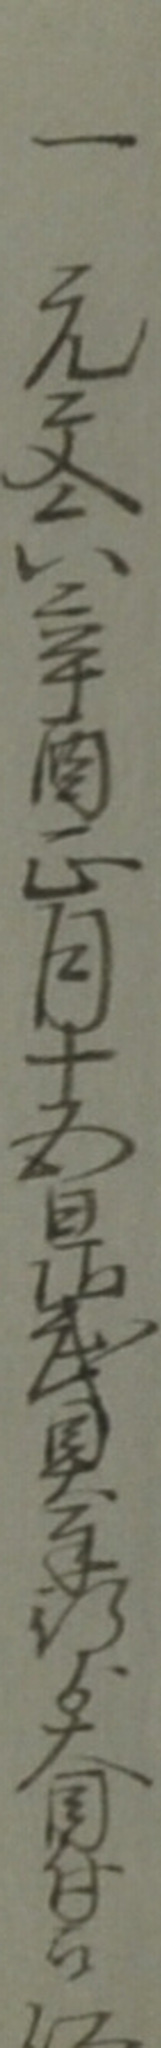一元文六辛酉正月十五日御武具奉行ゟ大目付被仰付
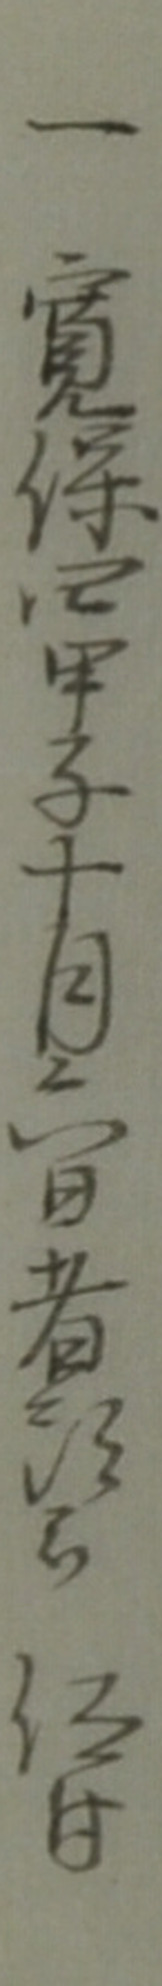一寛保四甲子十月六日者頭被仰付
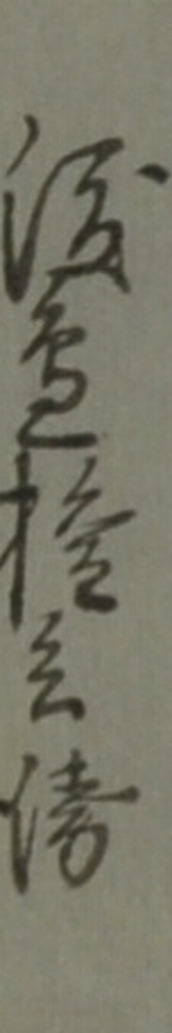渡辺権兵衛

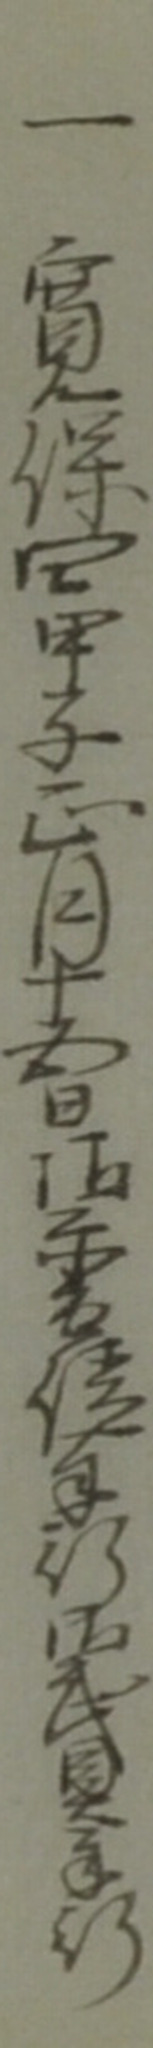一寛保四甲子正月十五日御普請奉行御武具奉行
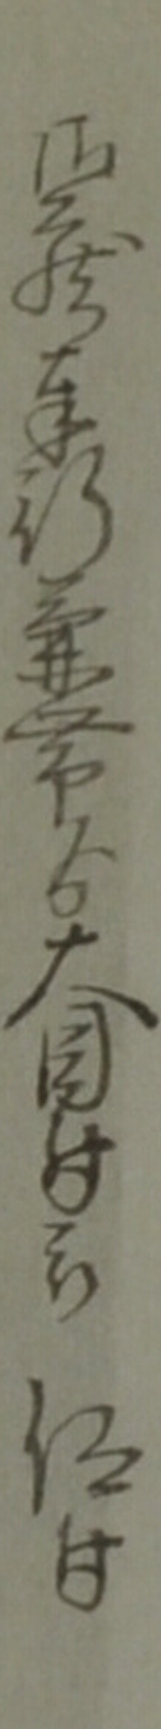御蔵奉行兼帯ゟ大目付被仰付
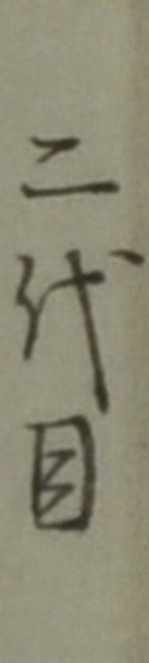二代目
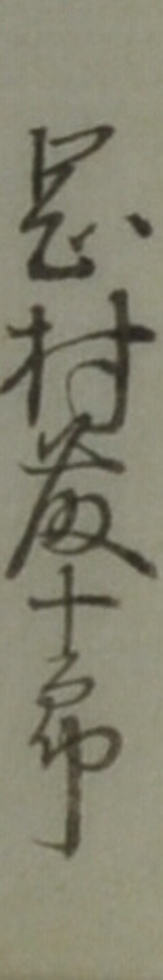岡村藤十郎
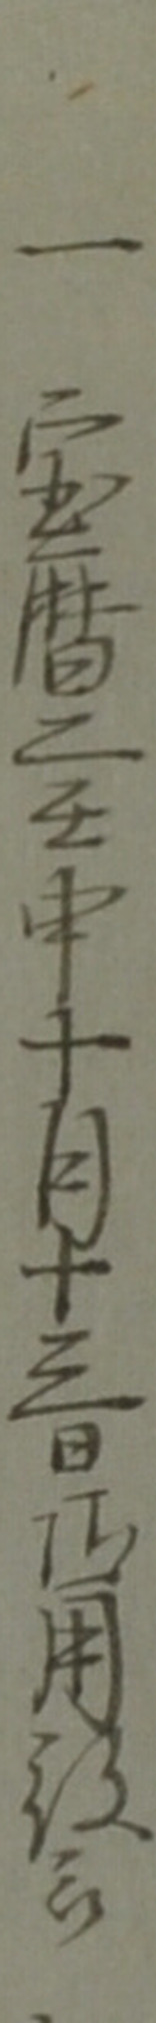一宝暦二壬申十月十三日御用役被仰付
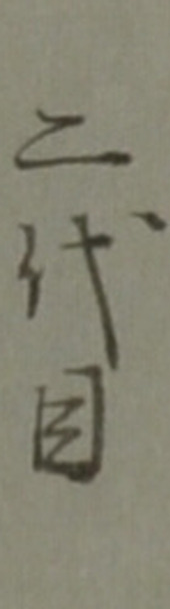二代目
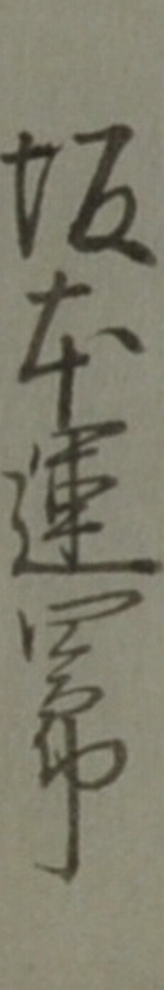坂本運四郎
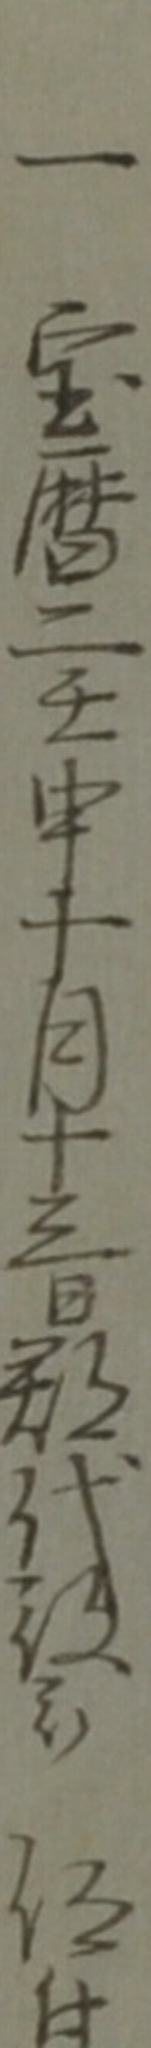一宝暦二壬申十月十三日郡代役被仰付
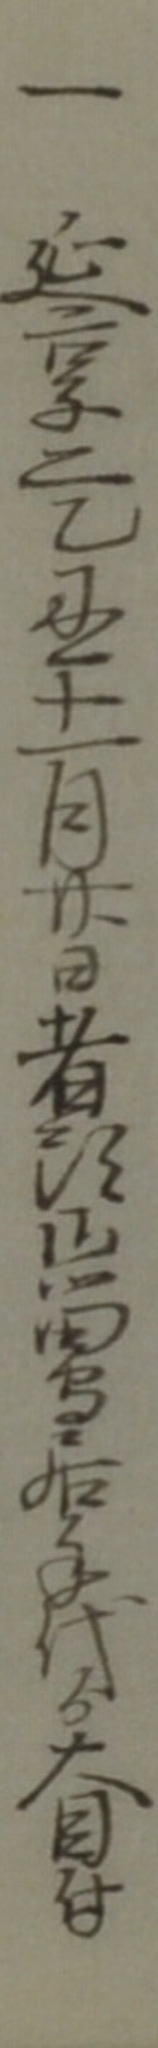一延享二乙丑十一月廿日者頭御留守居手代ゟ大目付
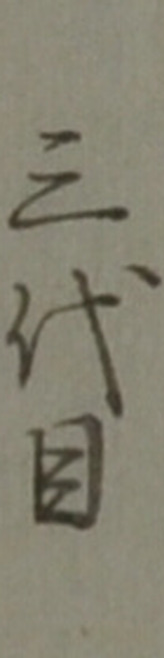三代目
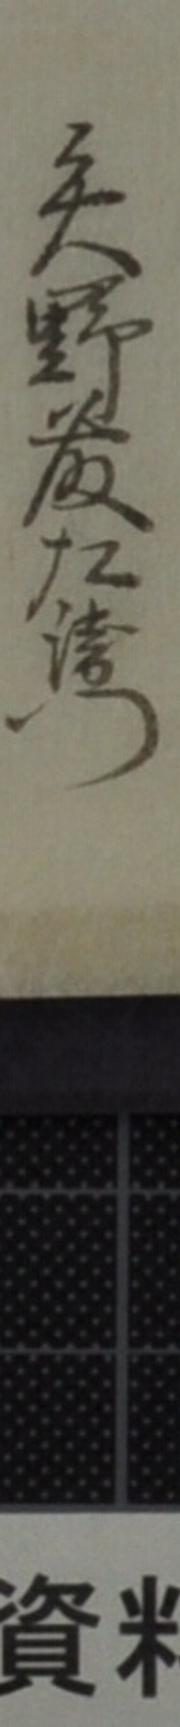矢野藤左衛門
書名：諸御役代々録（三）
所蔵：伊那市立高遠町図書館・合同会社AMANE
